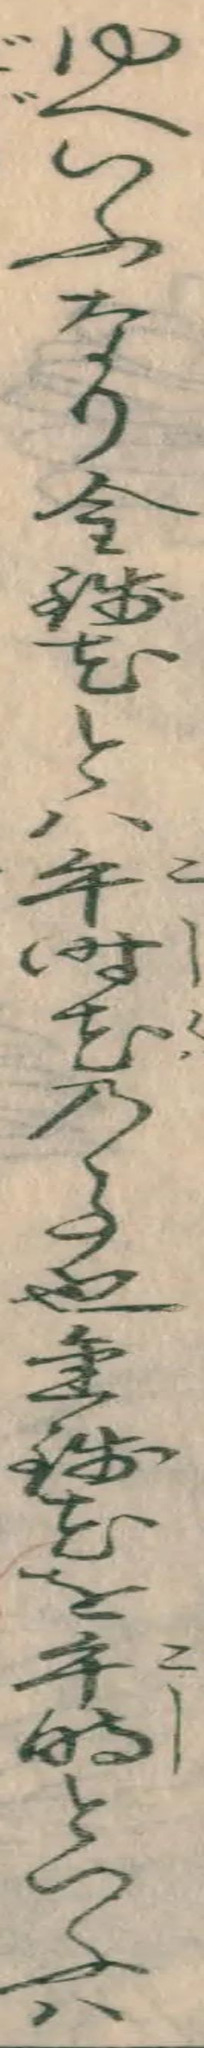ゆへいふなり金銭花とは午時花の事也金銭花を午時といふは
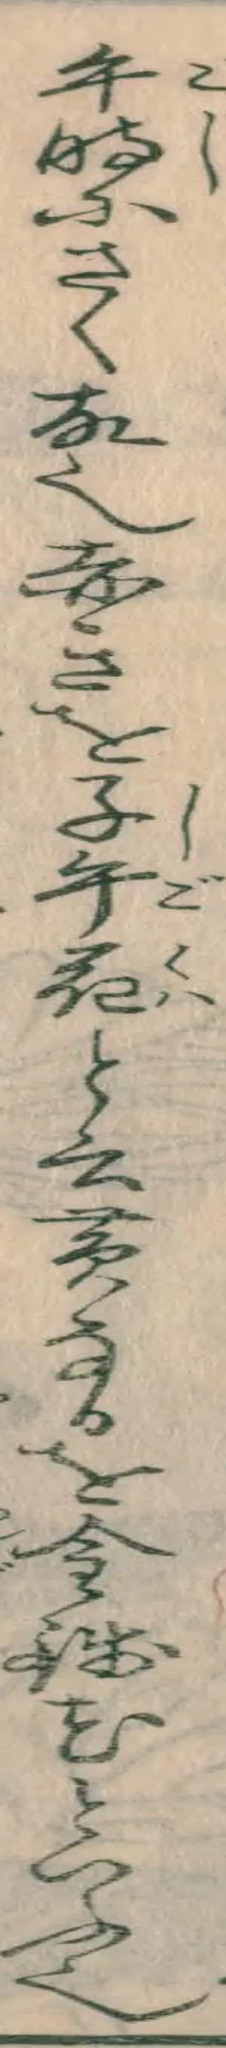午時にさく故也赤きを子午花と云黄なるを金銭花といふ也
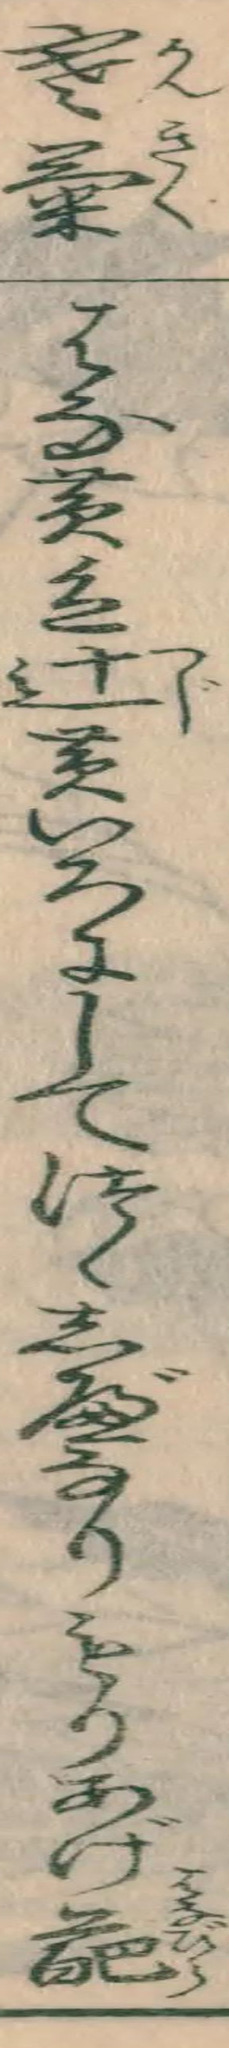[寒菊]はな黄色辻黄いろにしてつゝしべなりもりあげ葩
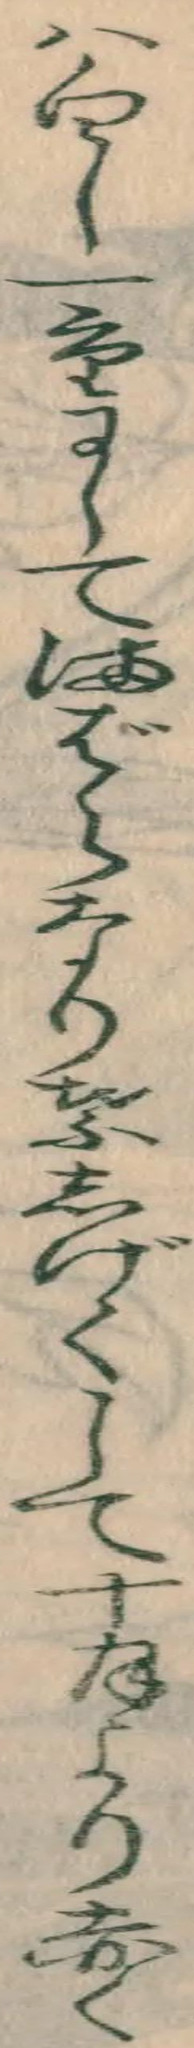は白し一重にしてまばらなり葉しげくして十月より赤く
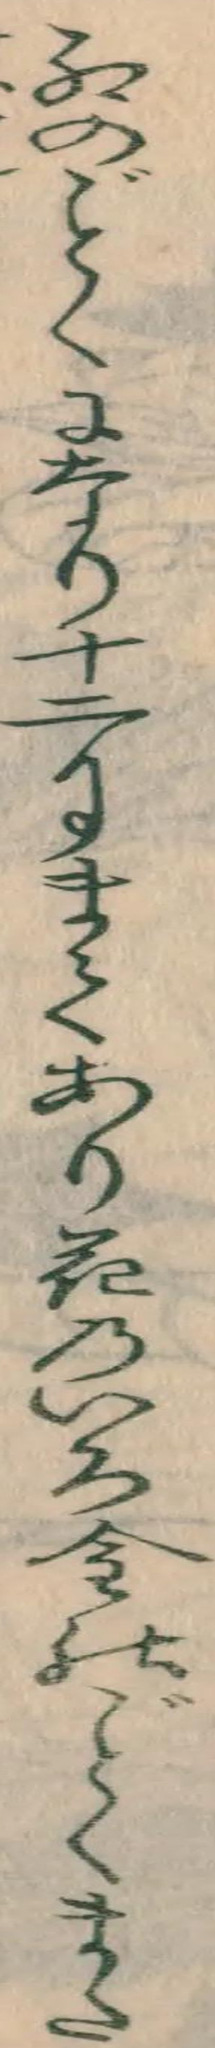紅のごとくになり十二月まてあり花のいろ金のごとくまた
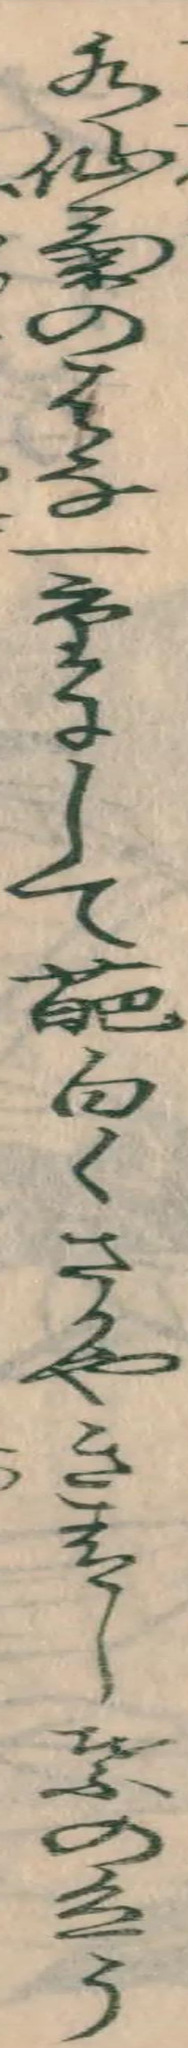水仙菊のはな一重にして葩白くさかやき青し葉の色う
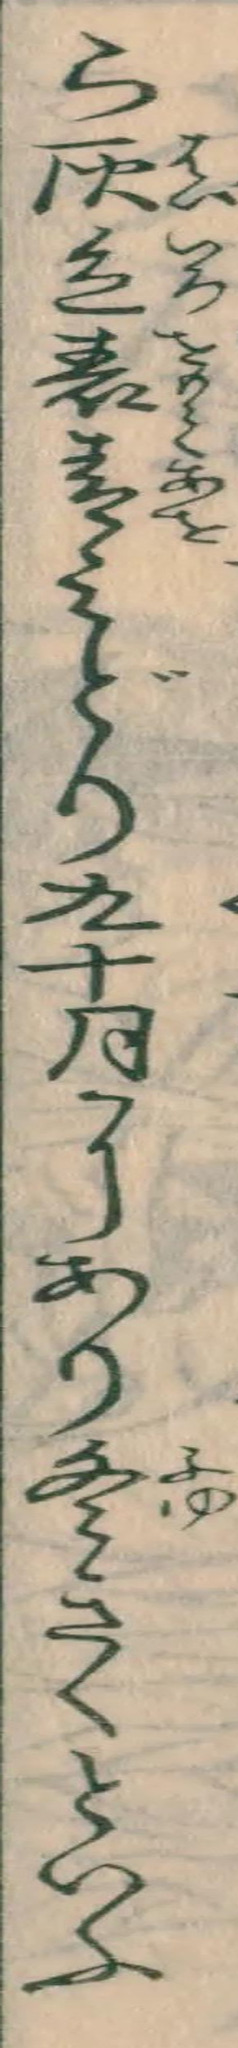ら灰色表青みどり九十月にあり冬きくといふ
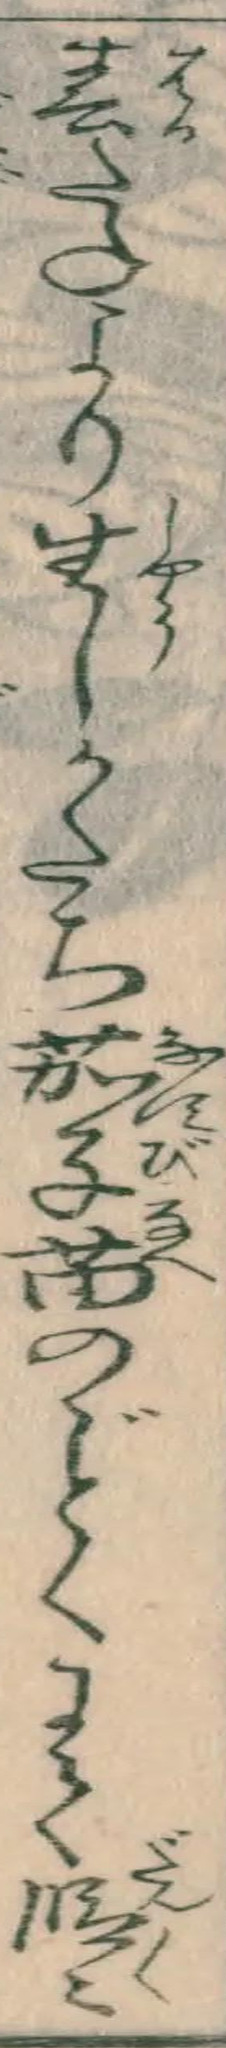春たねより生しかたち茄子苗のごとくにて段々
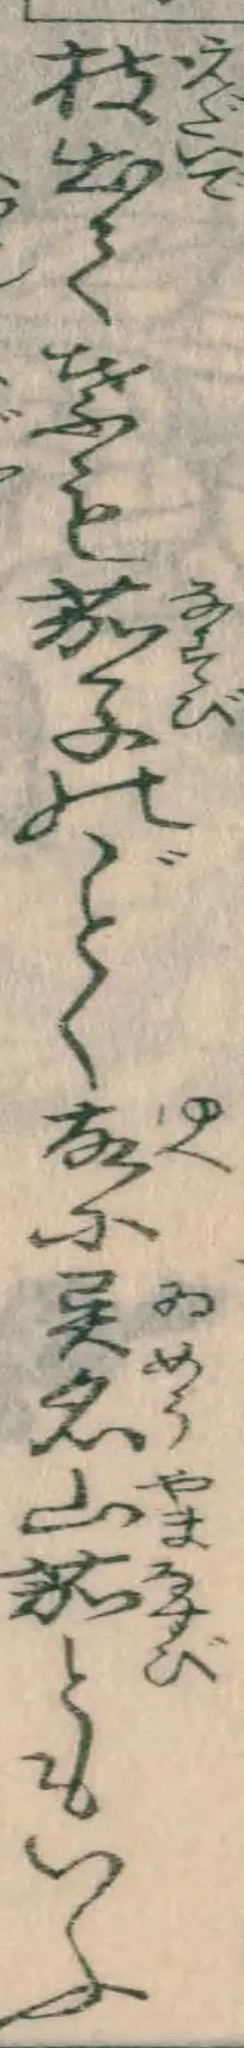枝出て葉も茄子のごとく故に異名山茄ともいふ
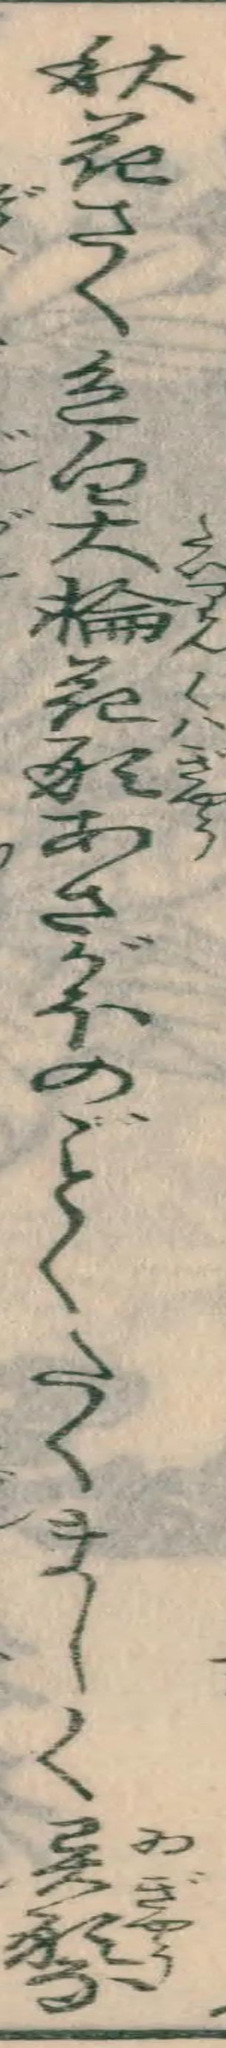秋花さく色白大輪花形あさがほのごとくたくましく異形な
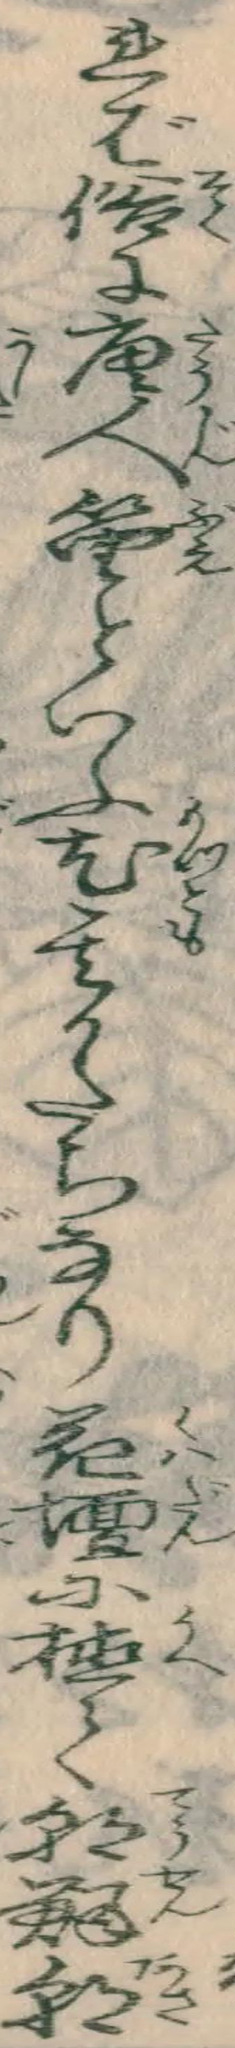れば俗に唐人笛といふ尤其かたちなり花壇に植て朝鮮朝
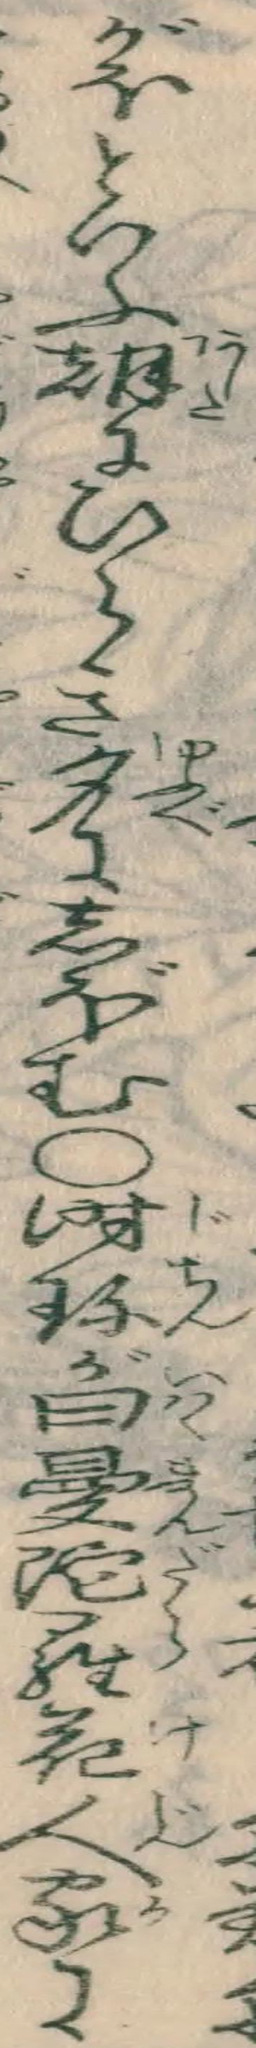がほといふ朝にひらき夕にしぼむ○時珍が曰曼陀羅花人家に
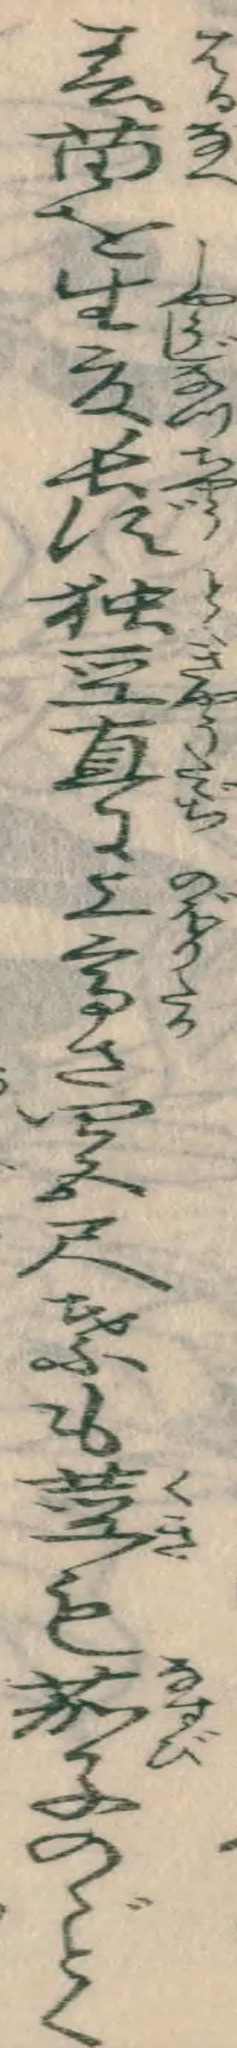春苗を生夏長ず独茎直に上高さ四五尺葉も茎も茄子のごとく
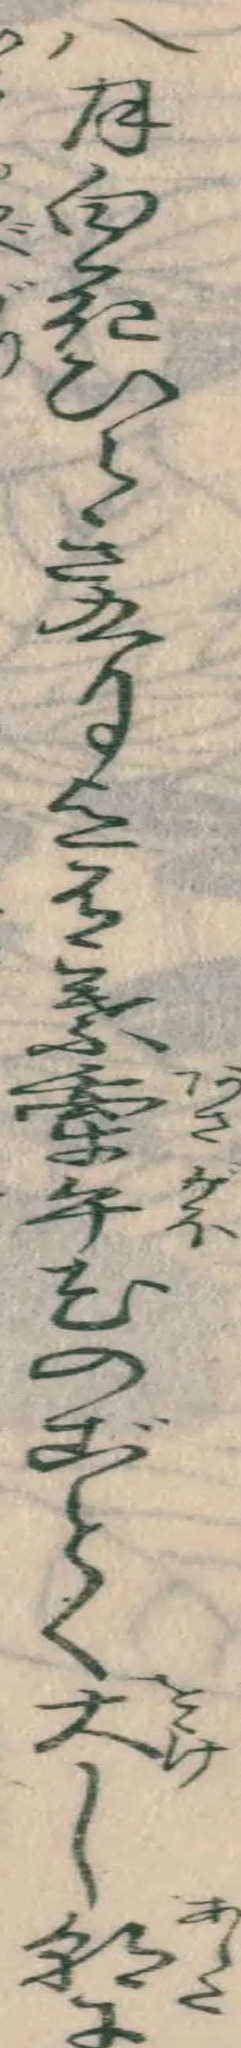八月白花ひらき九月迄有葉牽午花のごとく大し朝に
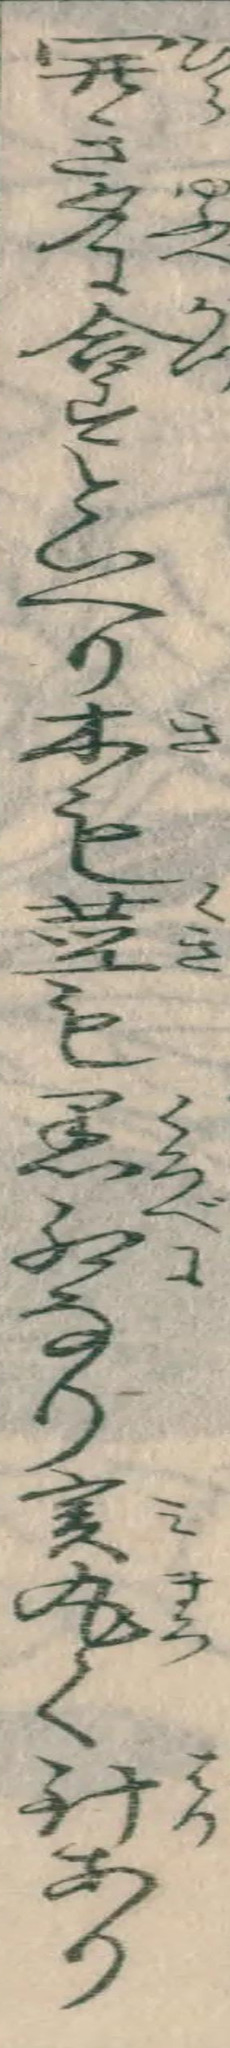開き夕に合すといへり木も茎も黒紅なり実丸く針あり
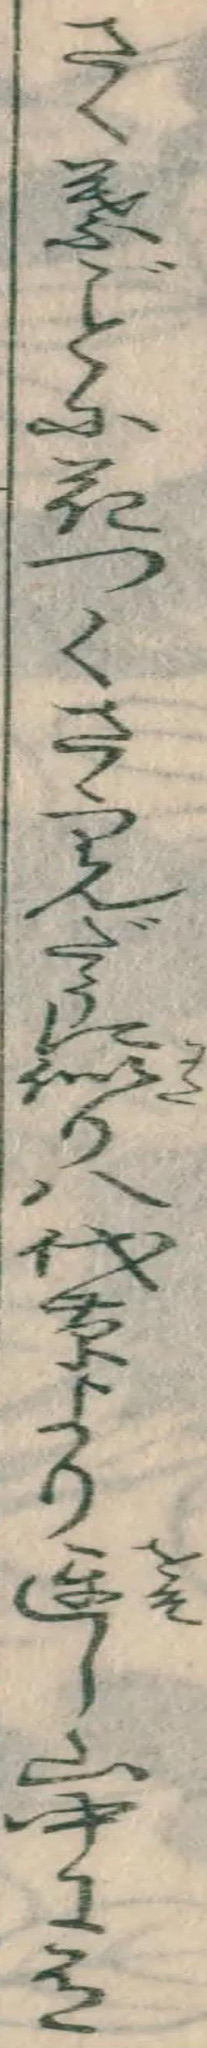さく葉ごとに花つくさゝりんだうに似り八代草より遅し山中に有
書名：畫本野山草. [4]
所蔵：国立国会図書館 National Diet Library, JAPAN
